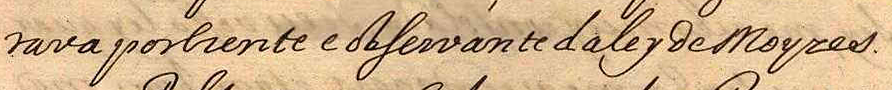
rava por Crente e observante da ley de Moyzes.
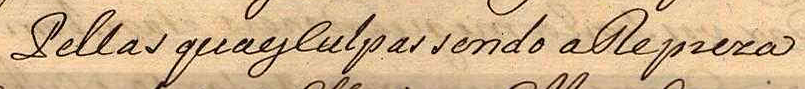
Pellas quaes culpas sendo a Re preza
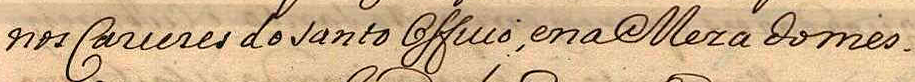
nos Carceres do santo Officio, e na Meza do mes
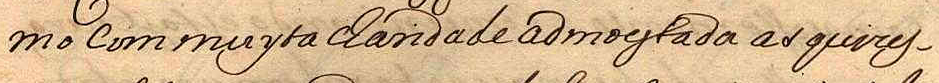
mo com muyta charidade admoestada as quizes
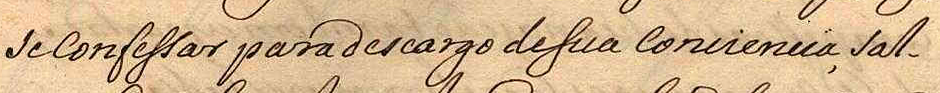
se confessar para descargo de sua conciencia, sal
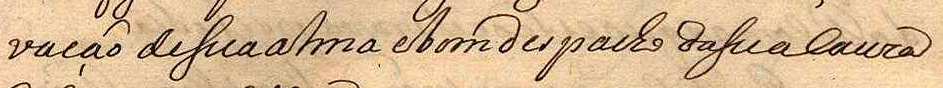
vaçaõ de sua alma e bom despacho da sua cauza
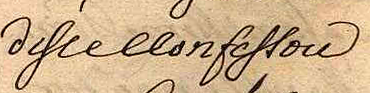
disse e confessou
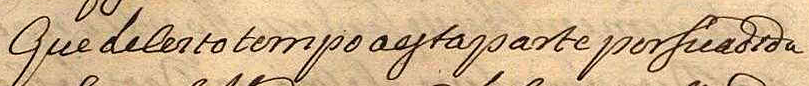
Que de Certo tempo a esta parte persuadida
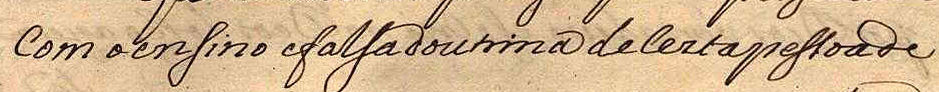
com o ensino e falsa doutrina de Certa pessoa de
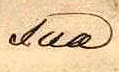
sua
